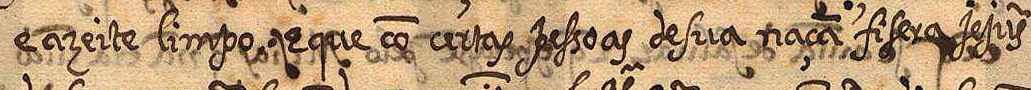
e azeite limpo E que cō certas pessoas de sua naçā fisera JeJūs
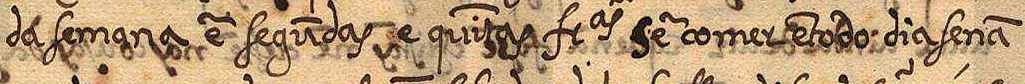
da semana ē segūdas e quītas fras sē comer ē todo dia senā
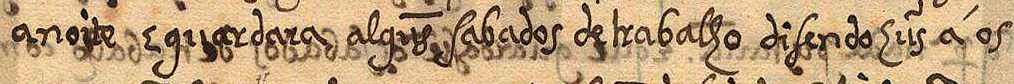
a noite E guardara algūs sabados de trabalho disendo hūs aos
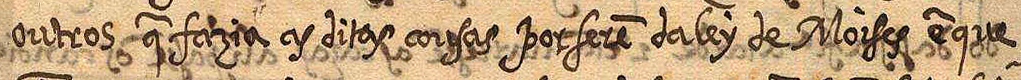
outros q̄ fazia as ditas cousas por serē da ley de Moises ē que
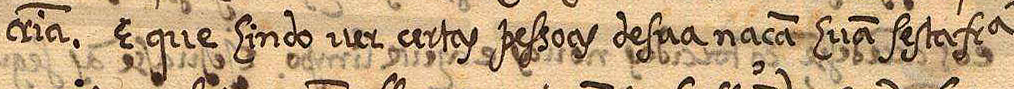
criā. E que hindo uer certas pessoas de sua naçā huā sesta fra
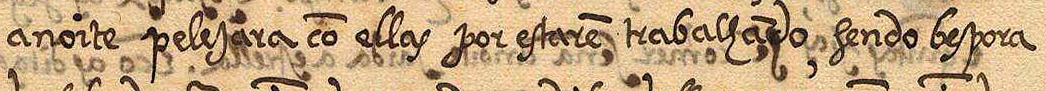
a noite pelejara cō ellas por estarē trabalhādo, sendo bespora
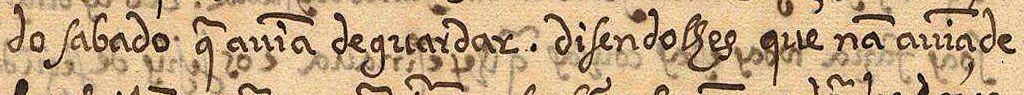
do sabado q̅ auiā de guardar. disendolhes que nā auiā de
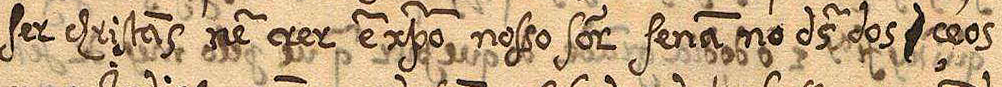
ser christãs nē crer ē xpō nosso sor̄ senā no ds̄ dos _ ceos
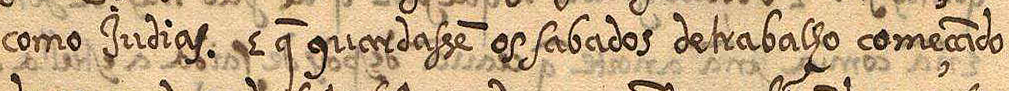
como Judias. E q̄ guardassē os sabados de trabalho começādo
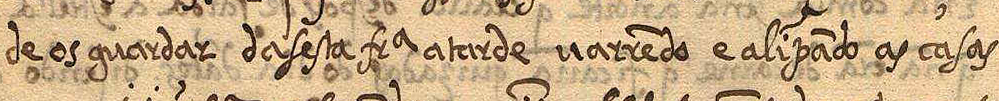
de os guardar da sesta fra a tarde uarrēdo e alīpādo as casas
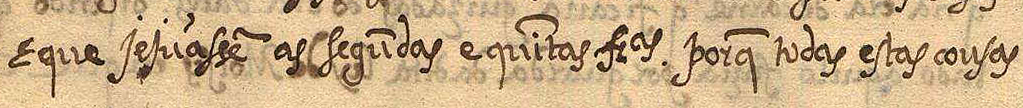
E que JeJuassē as segūdas e quītas fras. porq̄ todas estas cousas
